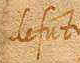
defūto
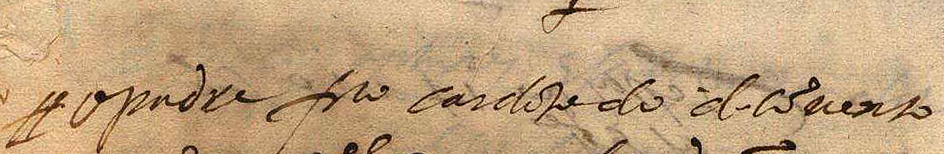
item o padre frco cardozo do d. cōuento
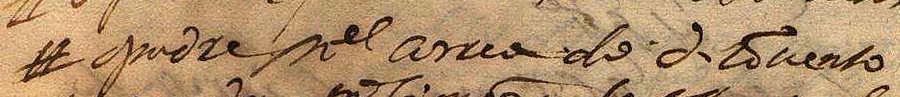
item o padre Mel correa do d. cōuento
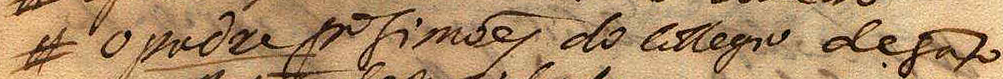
item o padre po simoẽs do collegio de sāto
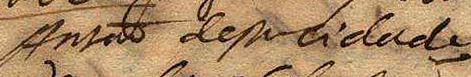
Antão desta cidade
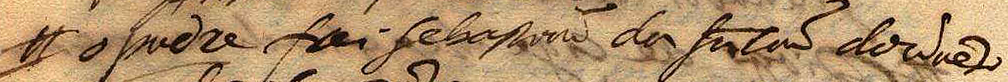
item o padre frei sebastiaõ dasūçaõ do cōuēto
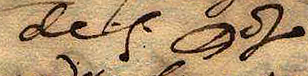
de S. Dos
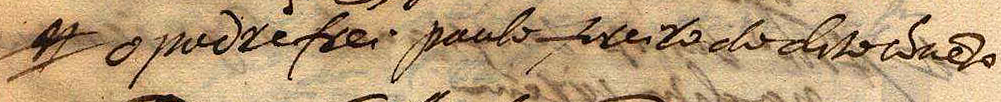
item o padre frei paulo foreiro do dito cōuēto
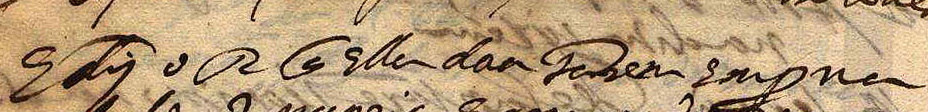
E diz o R q̄ Ella daa tābem Em ꝓua
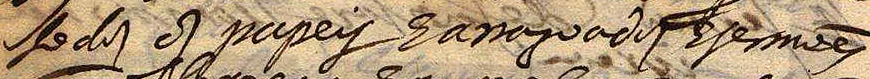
todos os papeis E arrasoados E sermoẽs
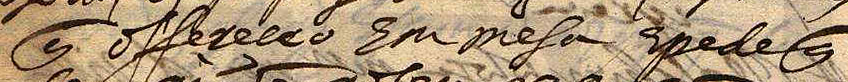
q̄ offereceo Em mesa E pede q̄
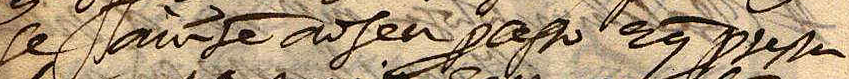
se aiūtē ao seu ꝓcesso E q̄ ꝓtesta
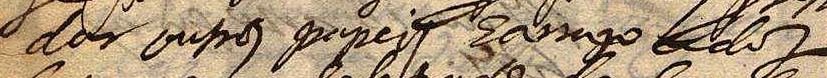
dar outros papeis E arrazoados
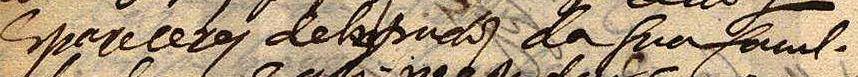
E pareceres de letrados da sua facul
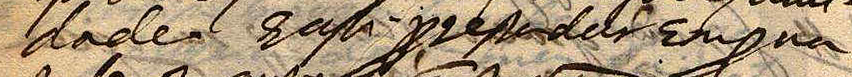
dade. E asi ꝓtesta dar Em ꝓua
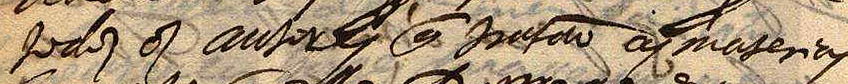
todos os autores q̄ trataõ as materias
